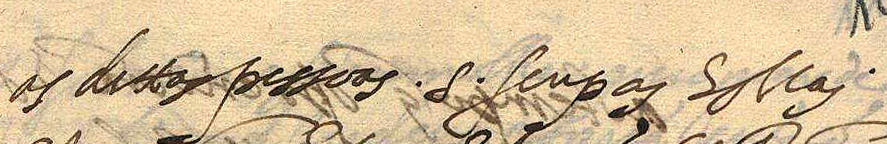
as dittas pessoas .s. seu paj E Maj
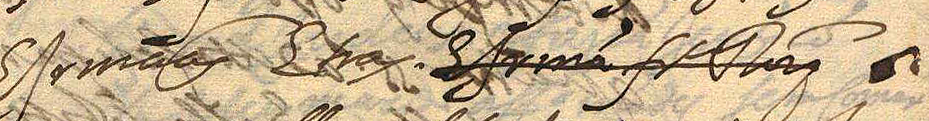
E Jrmaãs E tias E Jrmā frco Roiz̄
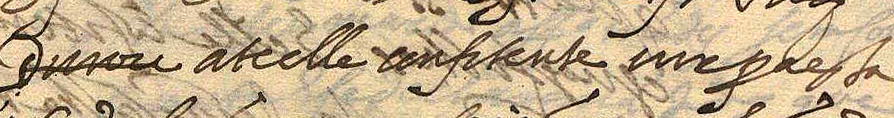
Durou ate elle confitente uir ꝑa esta
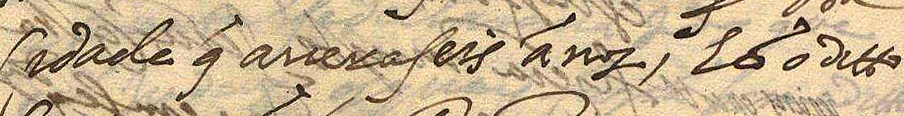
Cidade q̄ auera seis ānos, E cō o ditto
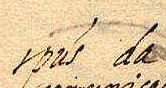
tpus̄ da
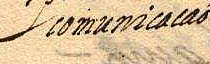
comunicaçaõ
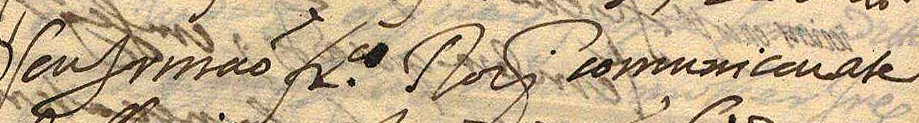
seu Jrmão fr.co Roiz̄ comunicou ate
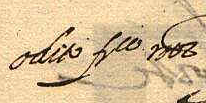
o dito frco roiz̄
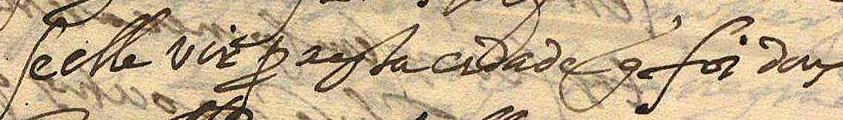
se elle vir ꝑa esta cidade q̄ foi dous
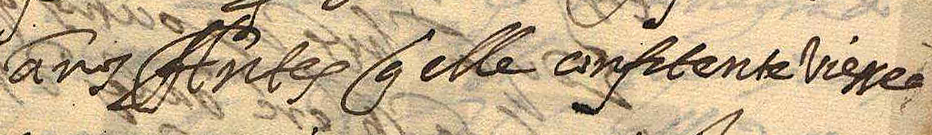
an̄os Antes q̄ elle confitente viesse
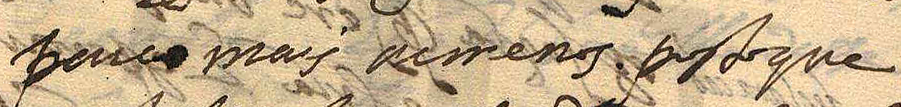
pouco mais ou menos posto que
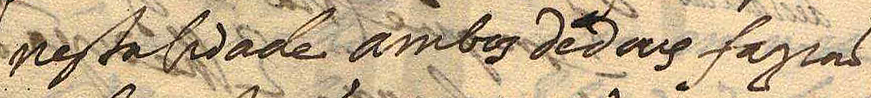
nesta Cidade ambos de dous faziaõ
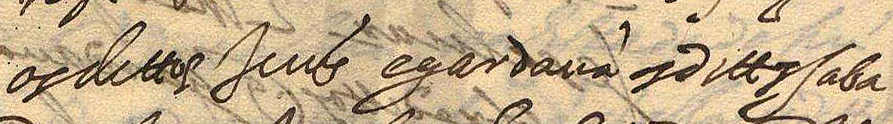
os dittos Jeiūs e gardauā os dittos saba
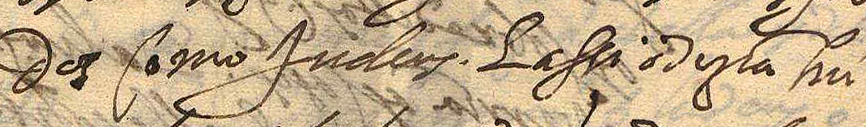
dos Como Judeus. E assi o deziā hū
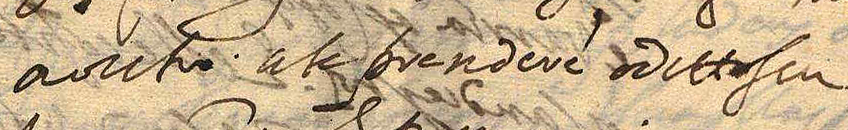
a outro ate prenderē o ditto seu
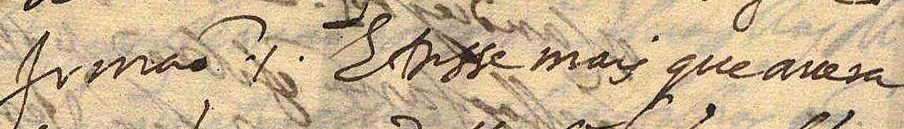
Jrmaõ ./. E Disse mais que auera
